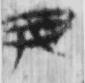母
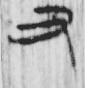又（有）
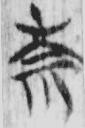柰
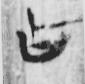占
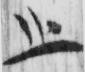之
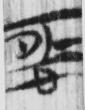恆
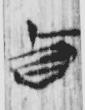貞
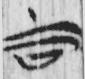吉
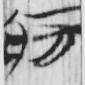病
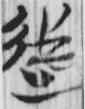递
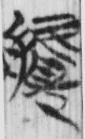○（瘥）
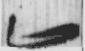㠯
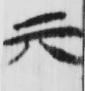亓
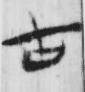古
